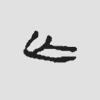亡
